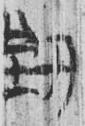型（形）
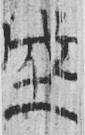城（成）
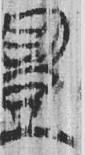豊（體）
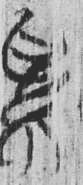○（奚）
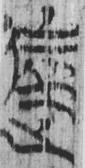○（失）
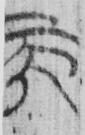而
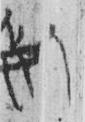死
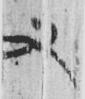又（有）
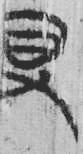○（得）
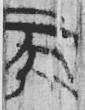而
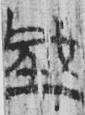城（成）
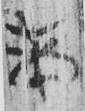未
